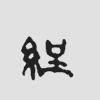{糸呈}
